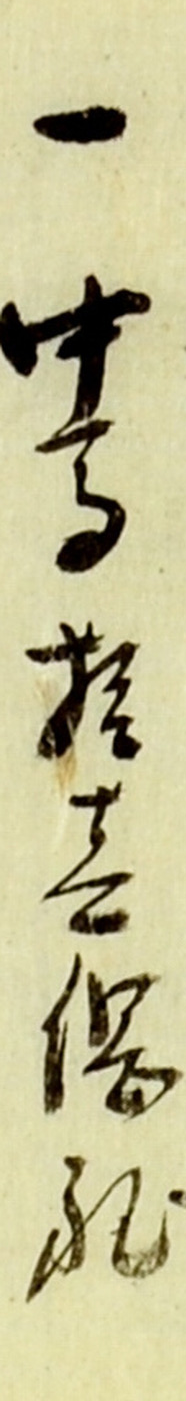一中馬拾壱綱程
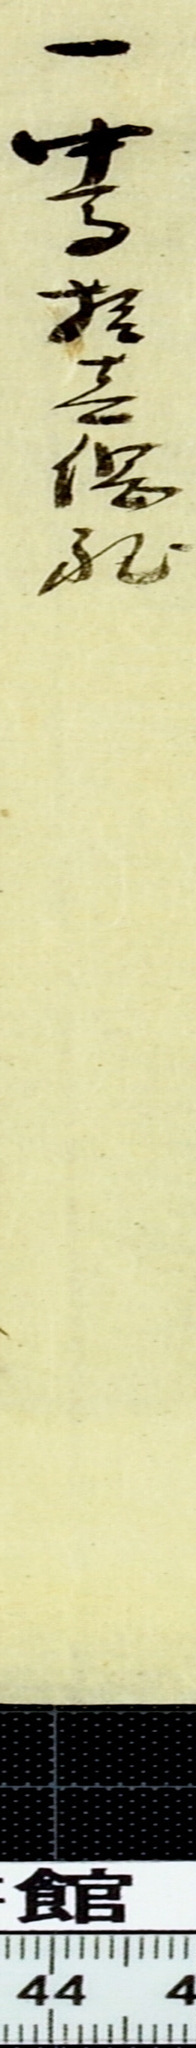一中馬拾壱綱程
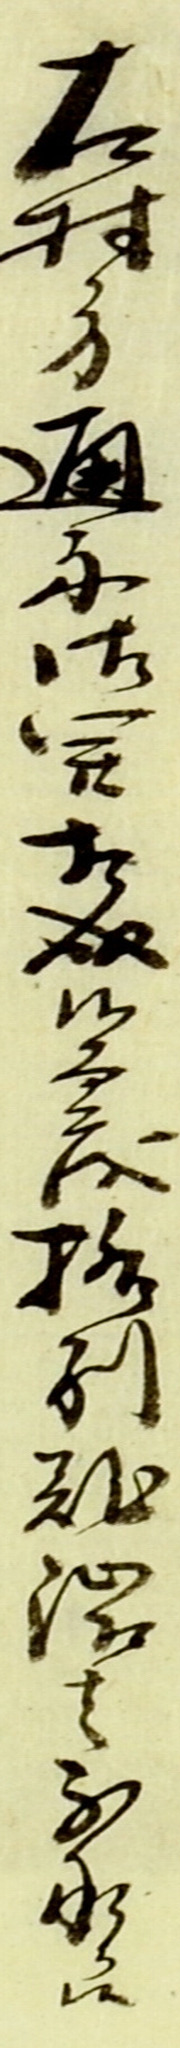右村方通舟御開相成候而も格別難渋は不承り候
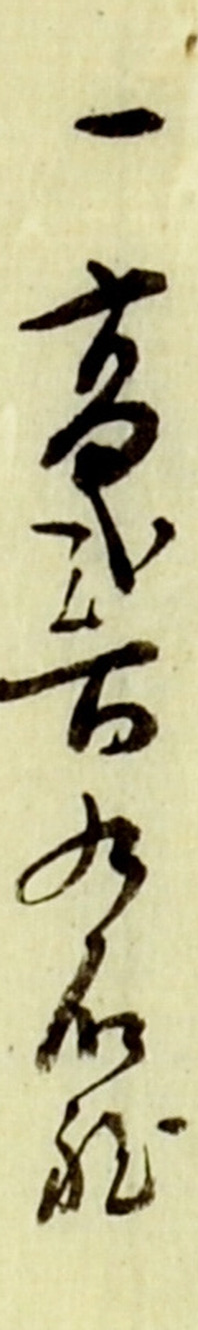一高弐百九石程
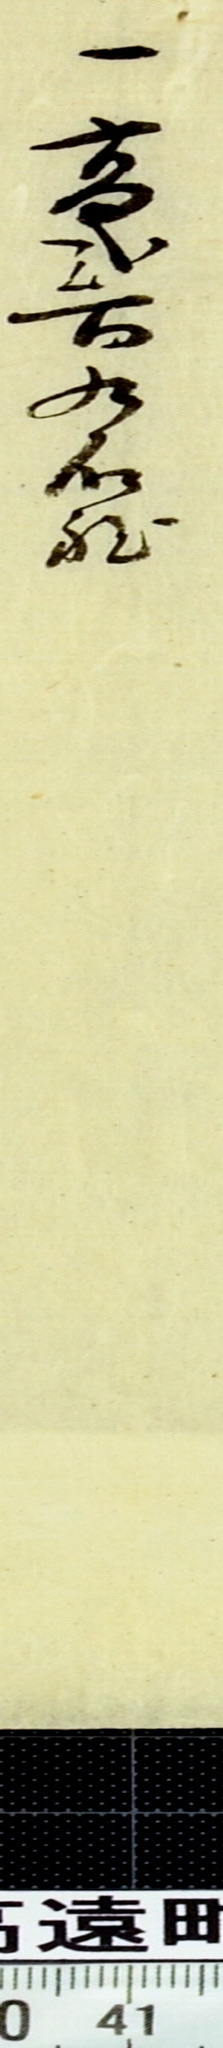一高弐百九石程
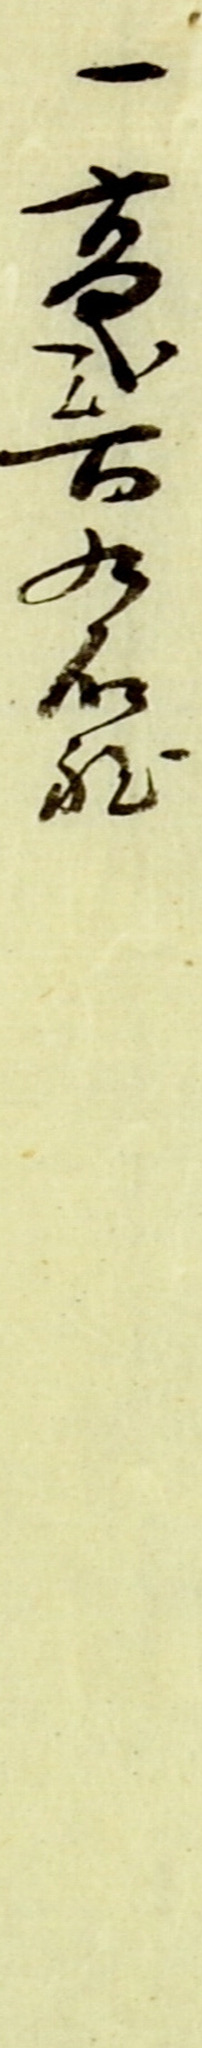一高弐百九石程
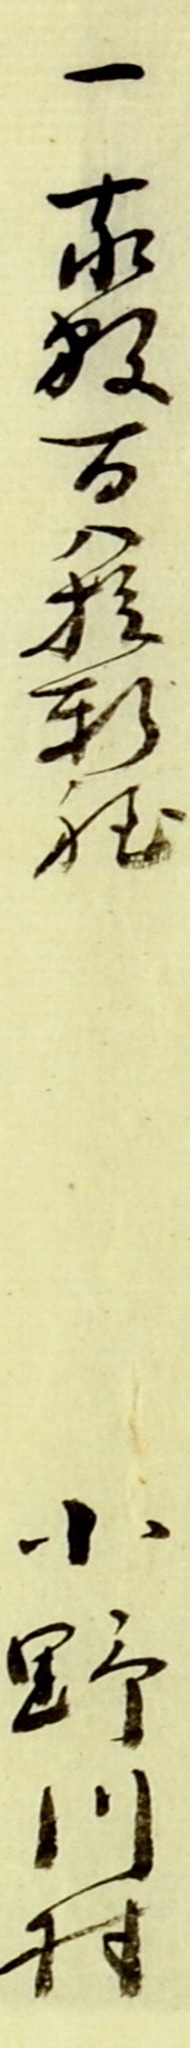一家数百八拾軒程小野川村
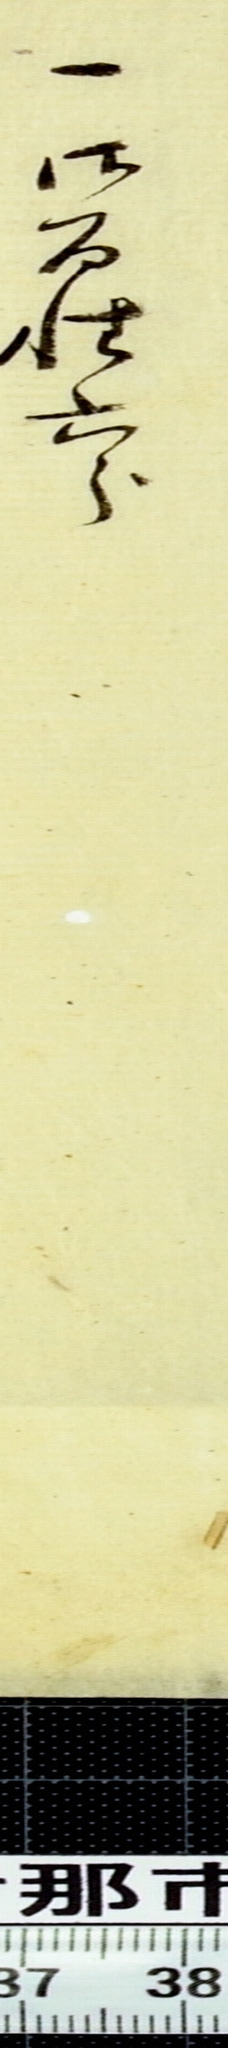一御百姓六分
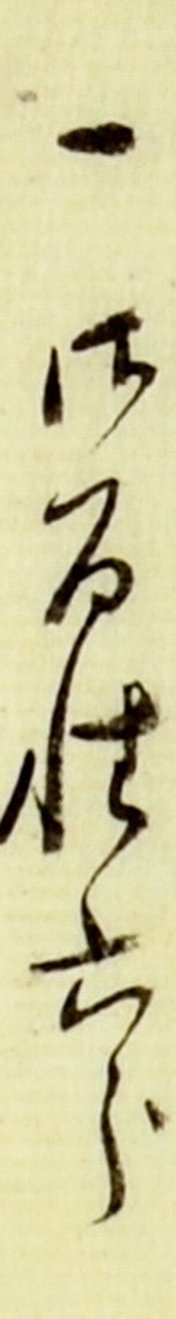一御百姓六分
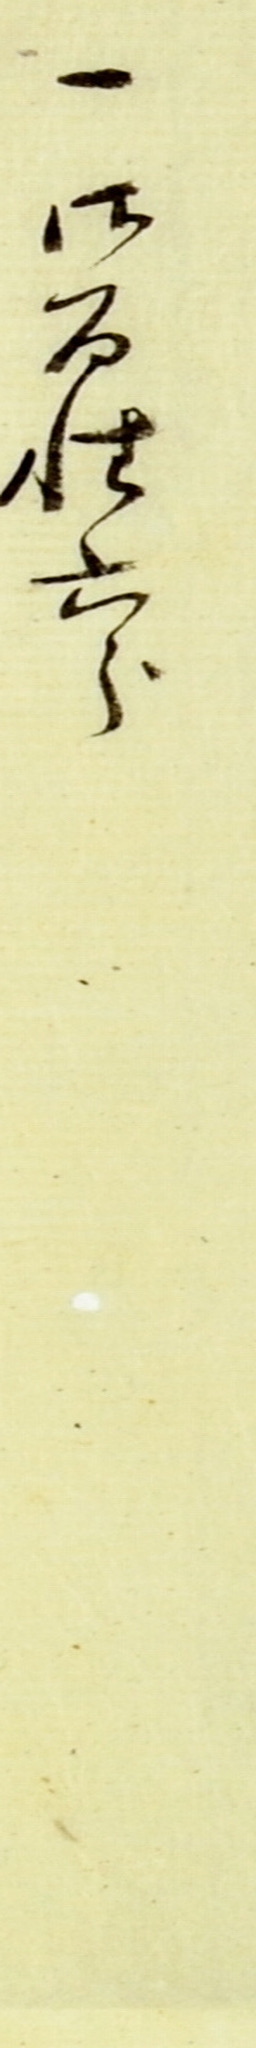一御百姓六分

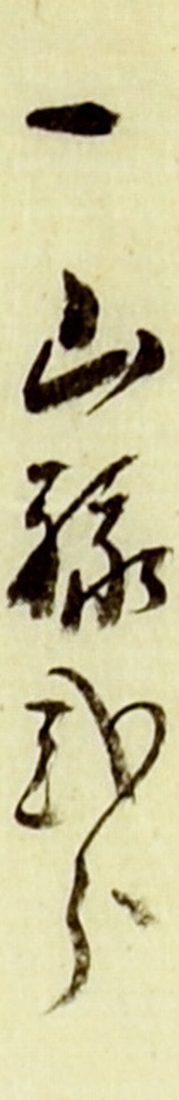一山禄弐分
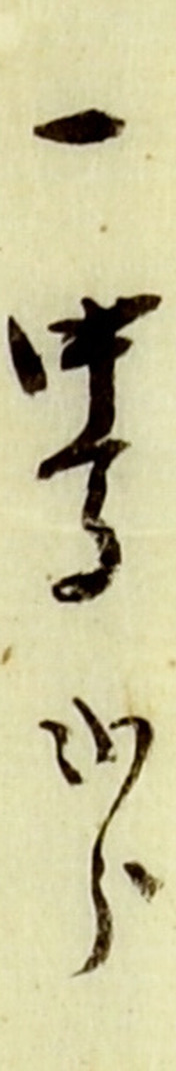一中馬弐分
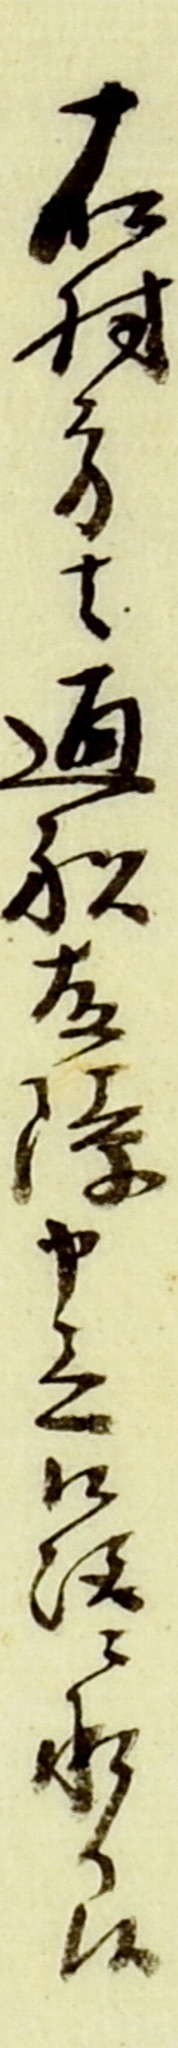右村方は通船故障申立候儀ニ承り候
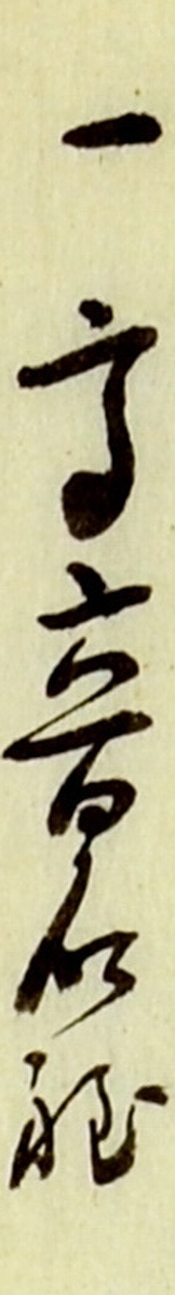一高六百石程
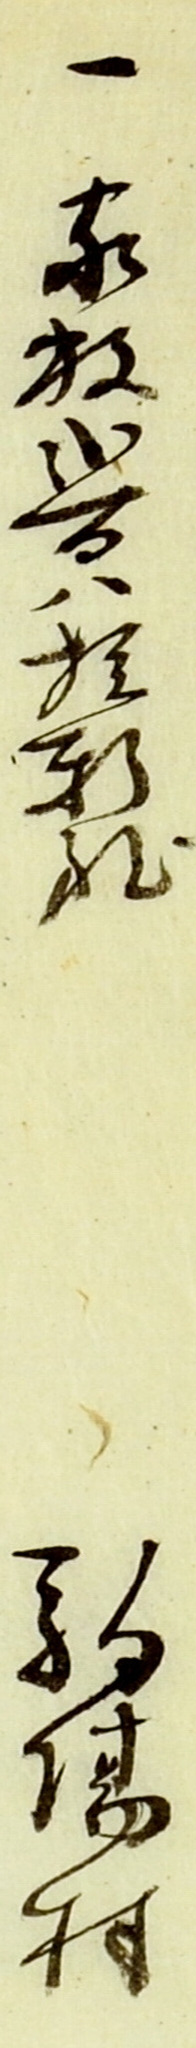一家数弐百八拾軒程駒場村
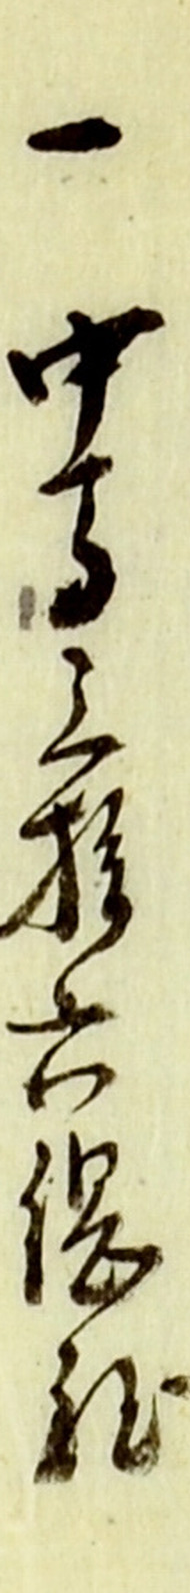一中馬三拾六綱程
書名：調査報告書
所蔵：伊那市立高遠町図書館・合同会社AMANE
